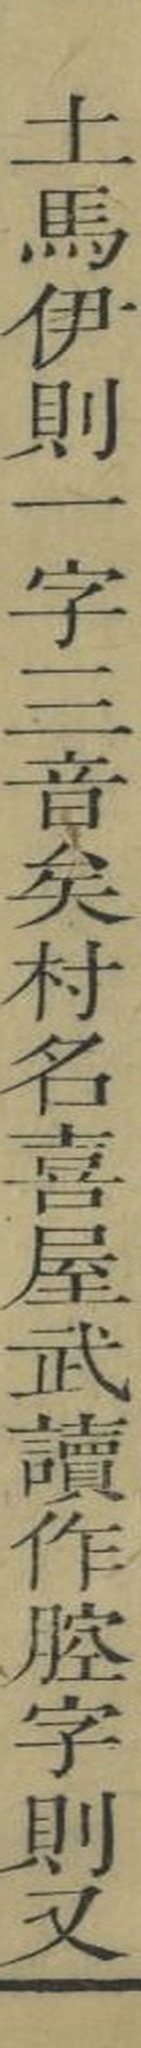土馬伊則一字三音矣村名喜屋武読作腔字則又
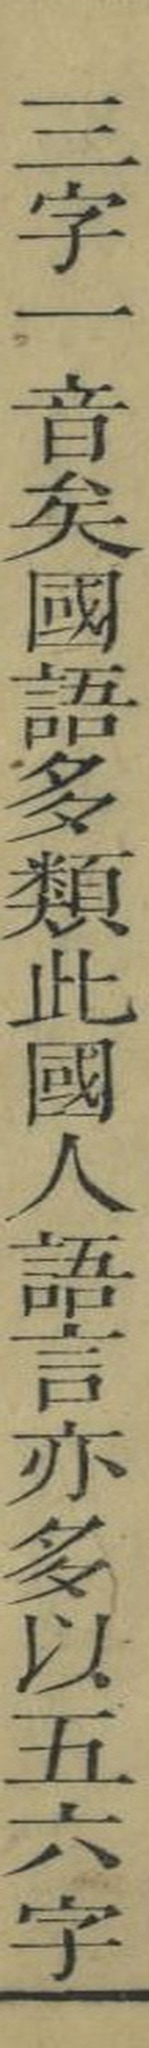三字一音矣国語多類此国人語言亦多以五六字
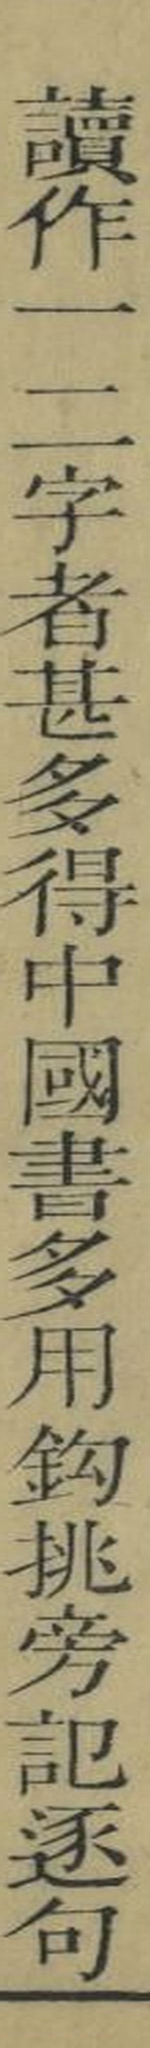読作一二字者甚多得中国書多用鈎挑旁記逐句
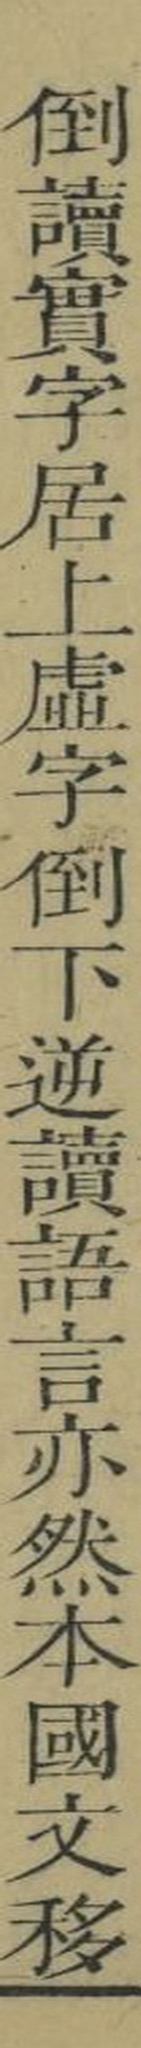倒読実字居上虚字倒下逆読語言亦然本国文移
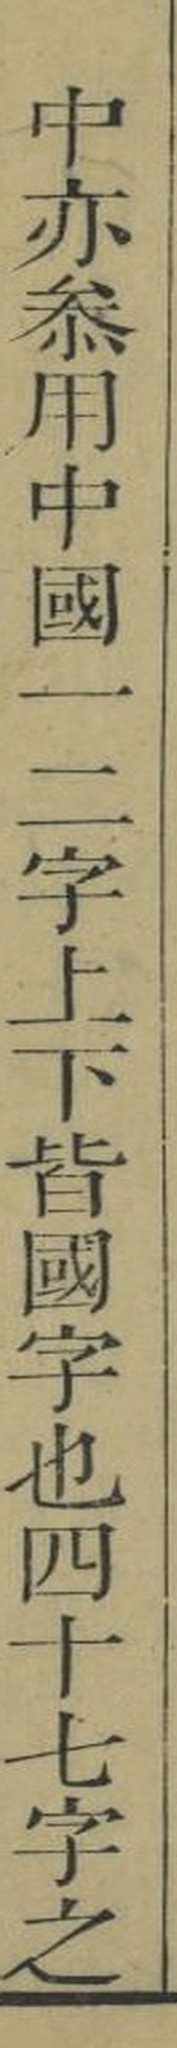中亦参用中国一二字上下皆国字也四十七字之
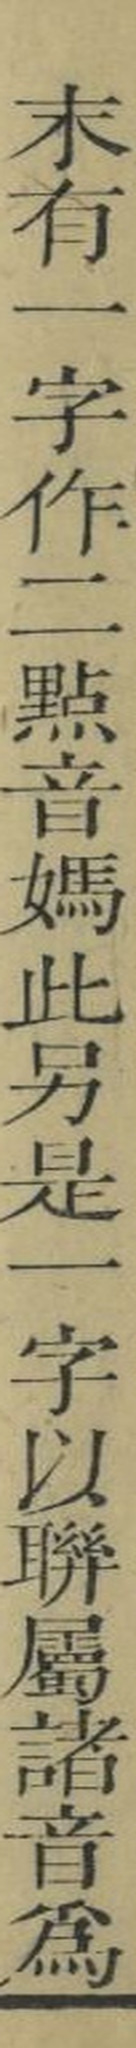末有一字作二点音媽此另是一字以聯属諸音為
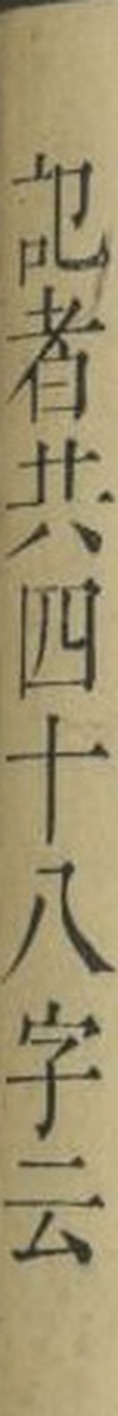記者共四十八字云
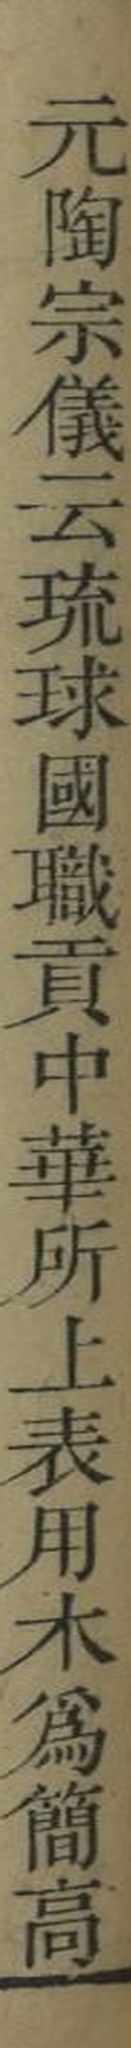元陶宗儀云琉球国職貢中華所上表用木為簡高
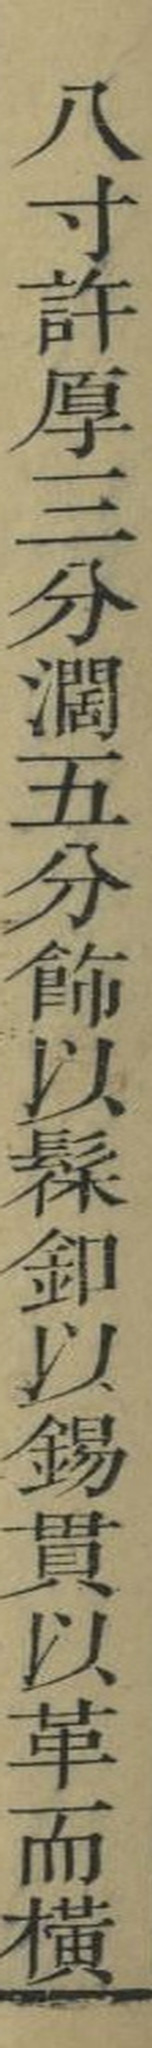八寸許厚三分濶五分飾以髹釦以錫貫以革而横
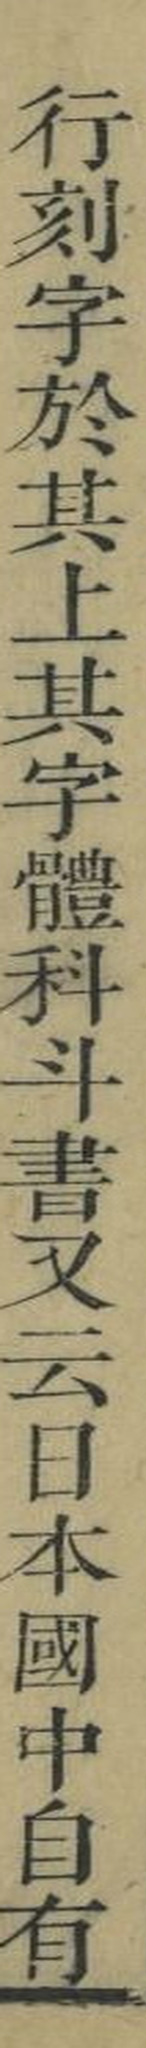行刻字於其上其字体科斗書又云日本国中自有
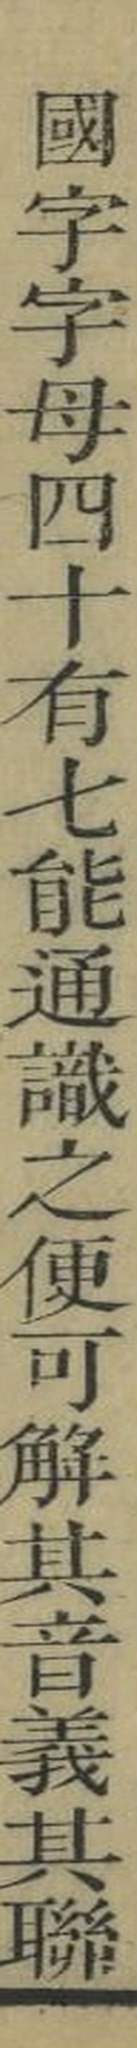国字字母四十有七能通識之便可解其音義其聯
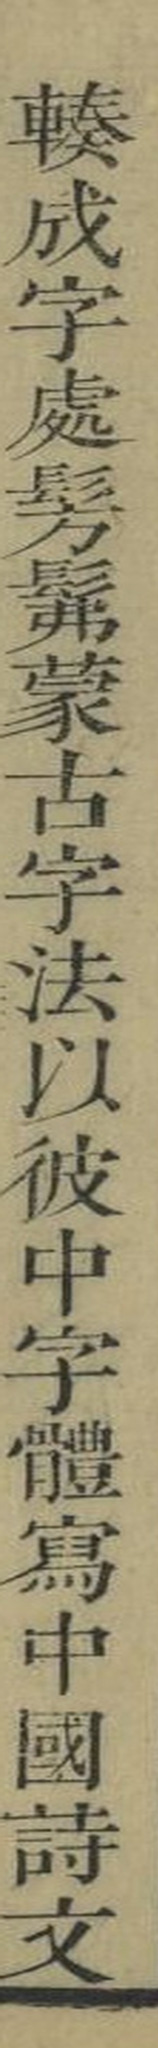輳成字処髣髴蒙古字法以彼中字体写中国詩文
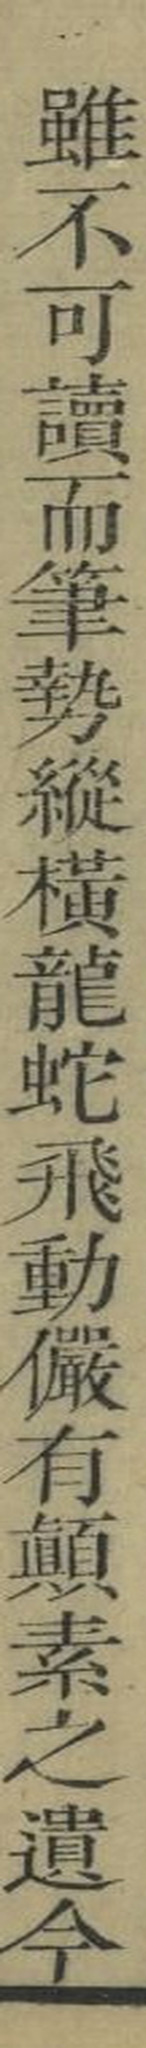雖不可読而筆勢縦横竜蛇飛動儼有顚素之遺今
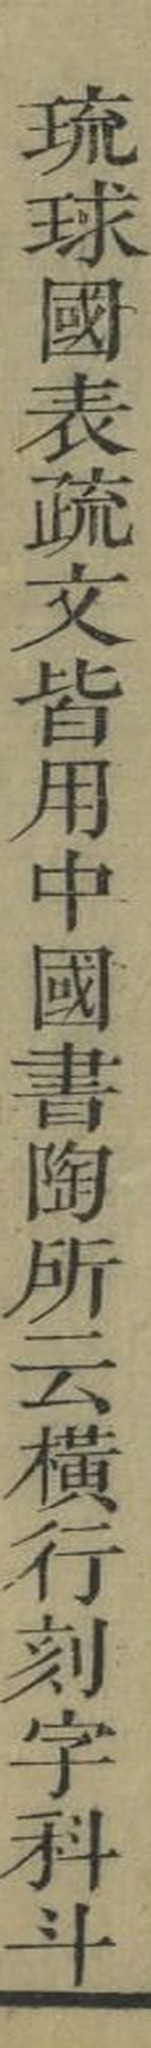琉球国表疏文皆用中国書陶所云横行刻字科斗
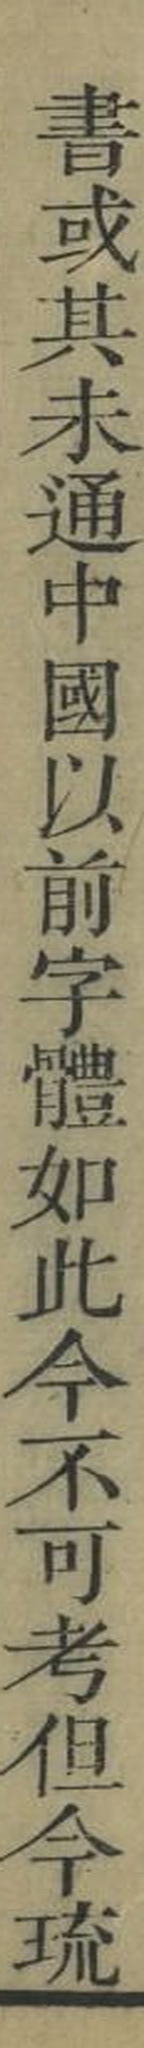書或其未通中国以前字体如此今不可考但今琉
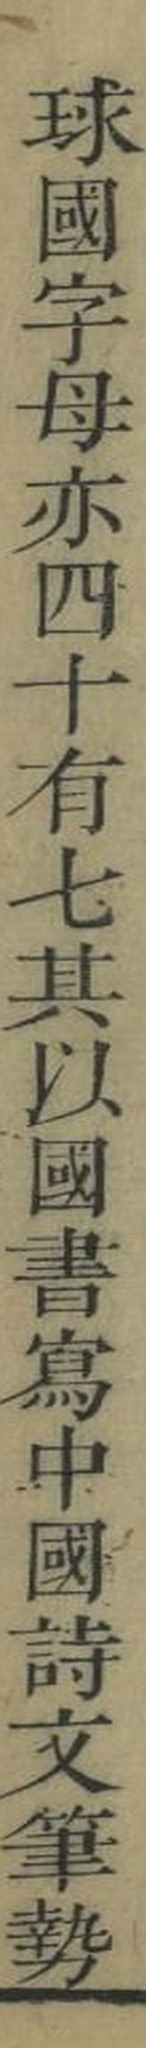球国字母亦四十有七其以国書写中国詩文筆勢
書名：中山伝信録 巻六
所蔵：University of the Ryukyus Library
